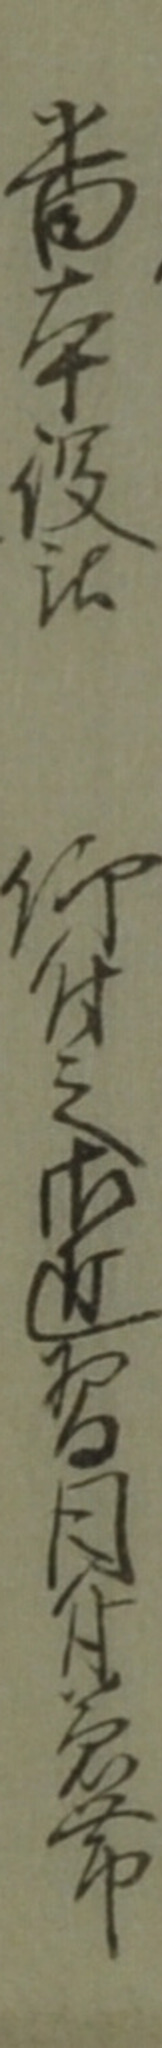番本役被仰付之御近習目付兼帯
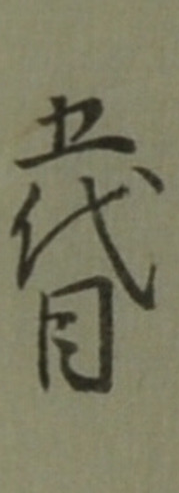五代目
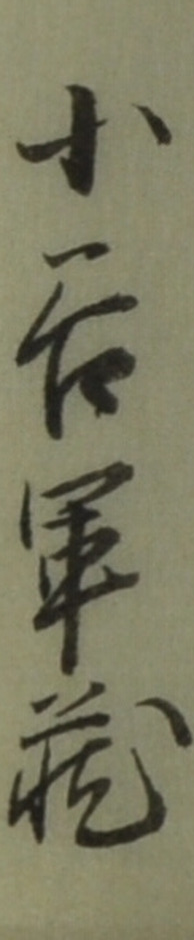小谷軍蔵

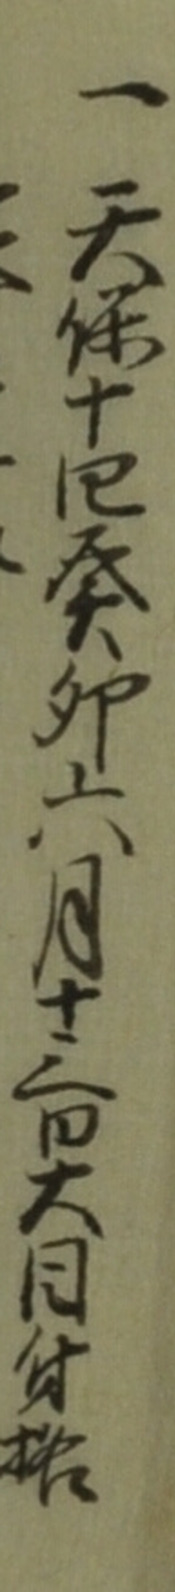一天保十四癸卯六月十三日大目付格
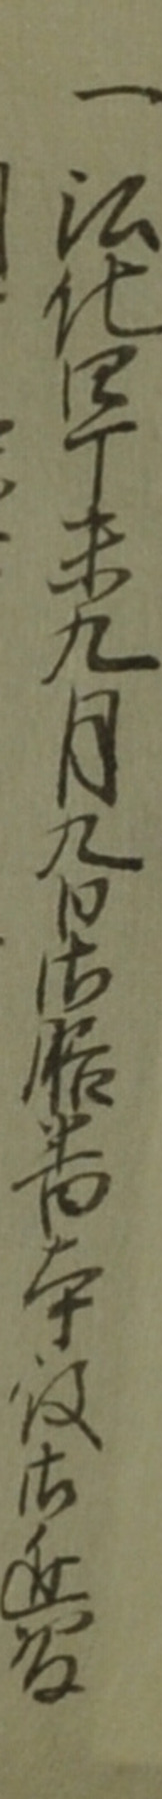一弘化四丁未九月九日御膳番本役御近習
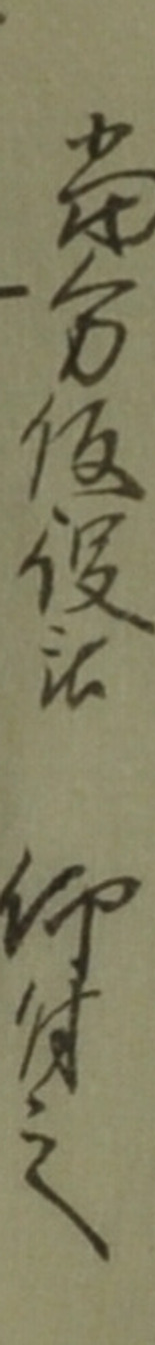当分仮役被仰付之
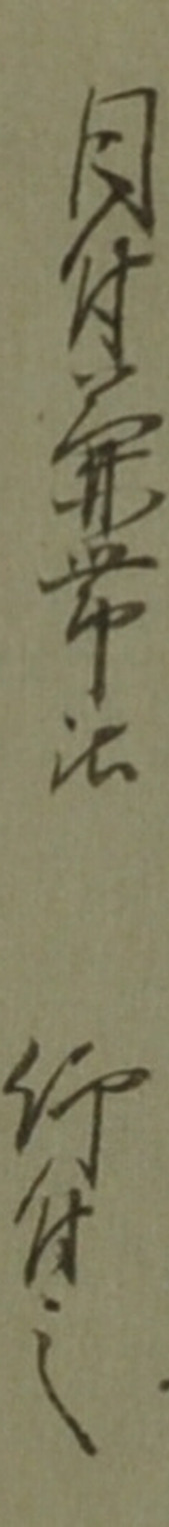目付兼帯被仰付之
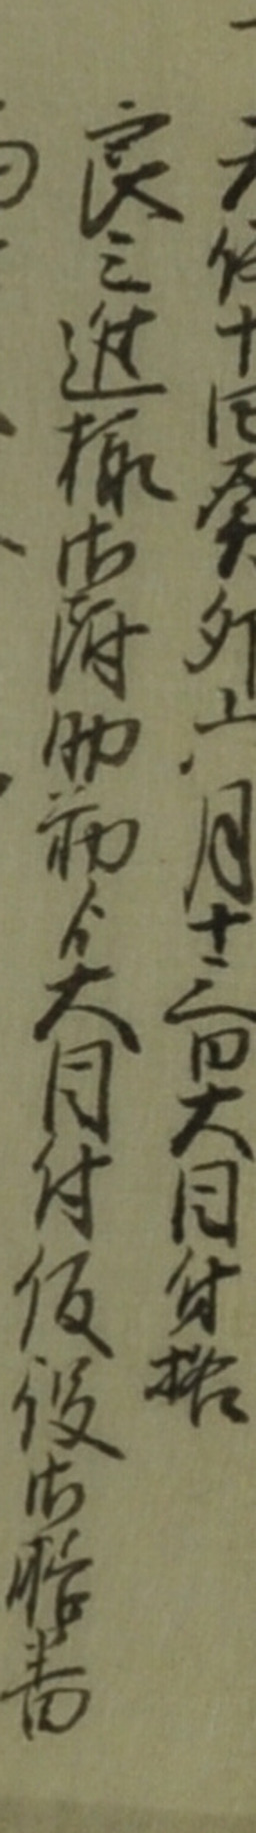良之進様御附助勤ゟ大目付仮役御膳番

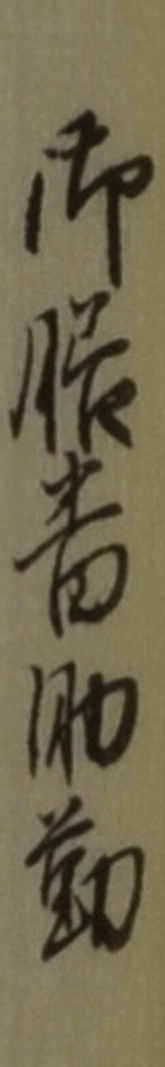御膳番助勤
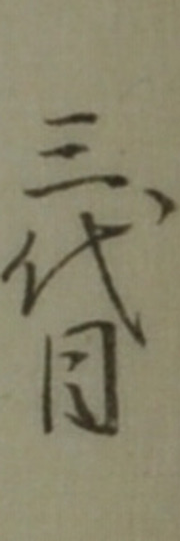三代目
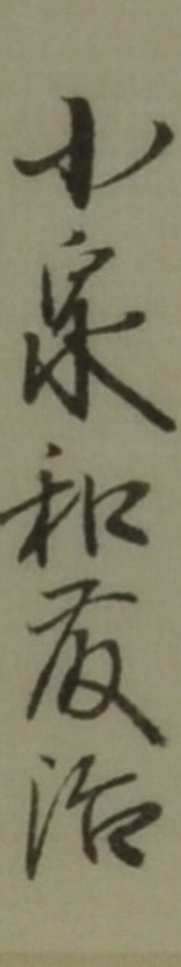小泉和藤治
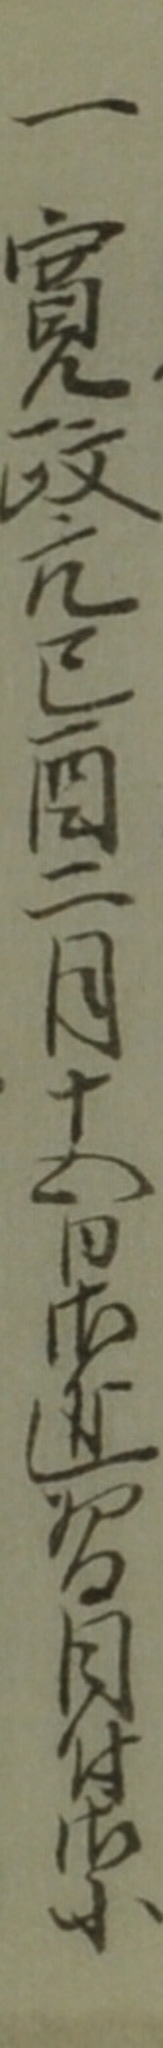一寛政元己酉二月十五日御近習目付御小
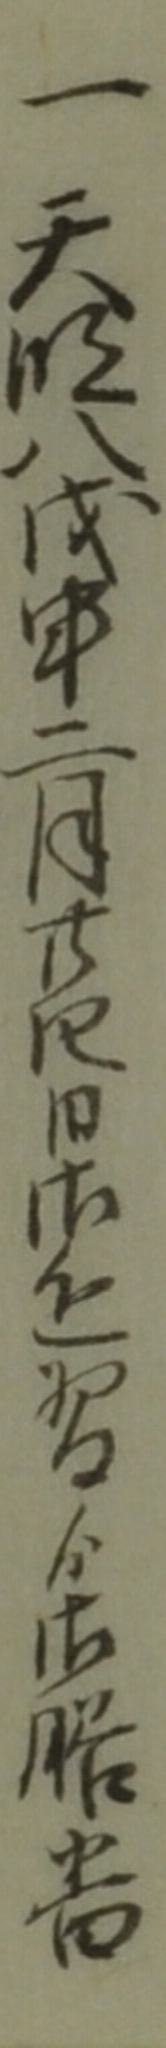一天明八戊申二月廿四日御近習ゟ御膳番
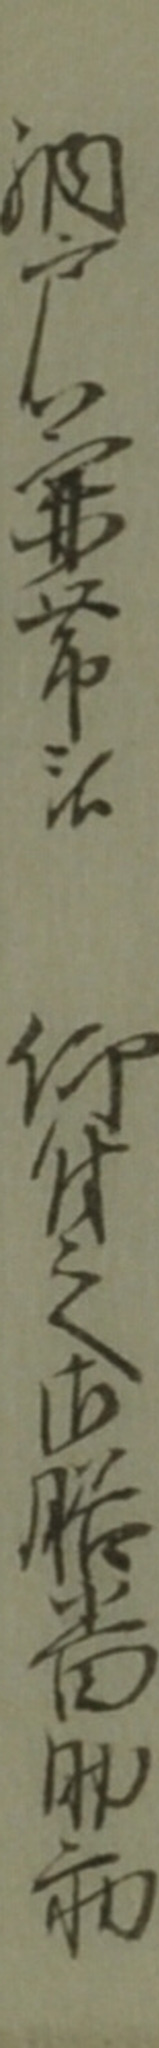納戸兼帯被仰付之御膳番助勤
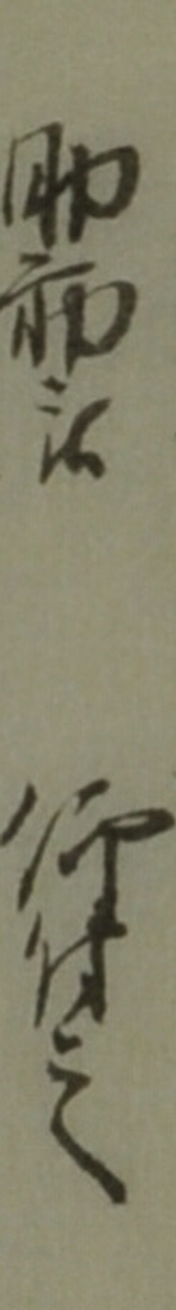助勤被仰付之
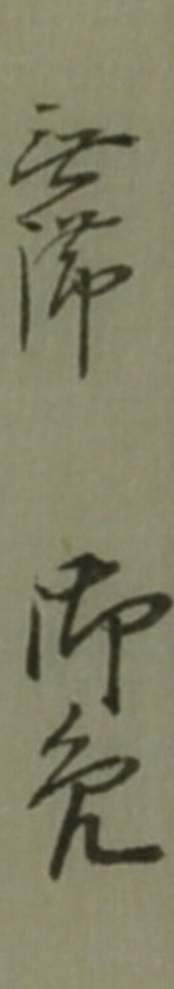無滞御免
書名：諸御役代々録（四）
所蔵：伊那市立高遠町図書館・合同会社AMANE
